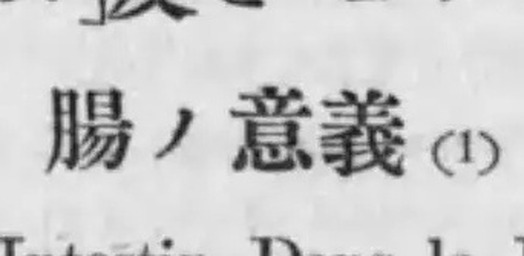腸の意義()
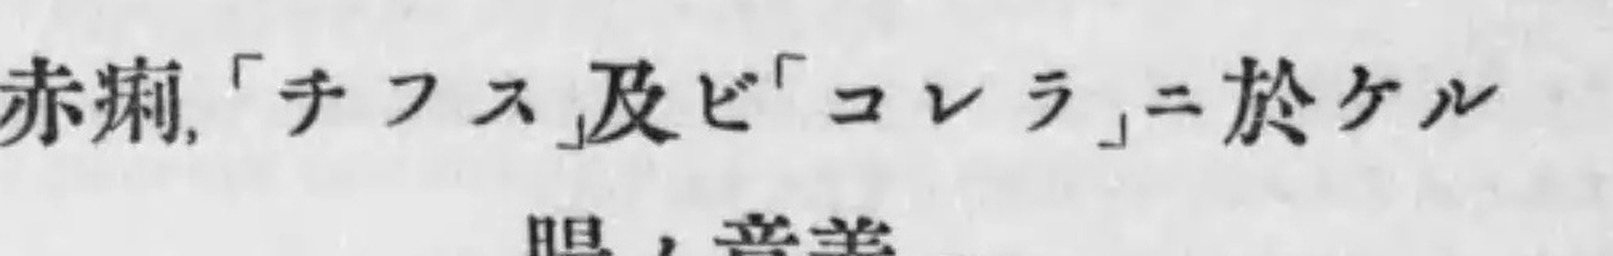赤痢、「チフス」及び「コレラ」に於ける

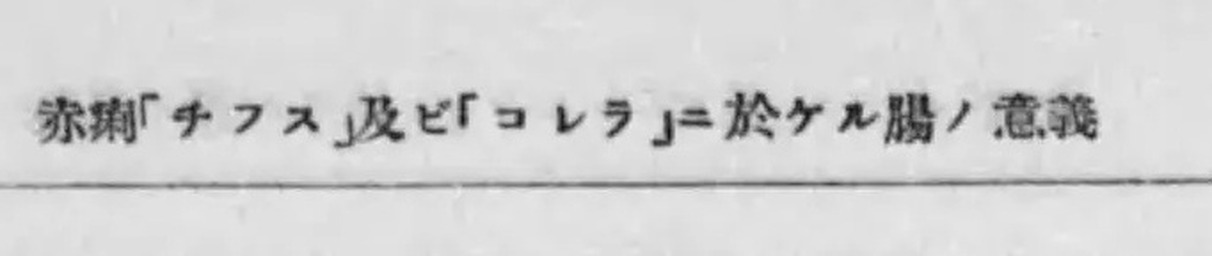赤痢「チフス」及び「コレラ」に於ける腸の意義
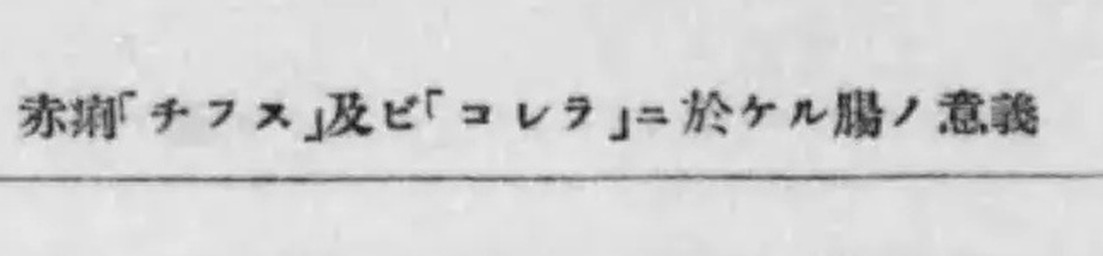赤痢「チフス」及び「コレラ」に於ける腸の意義

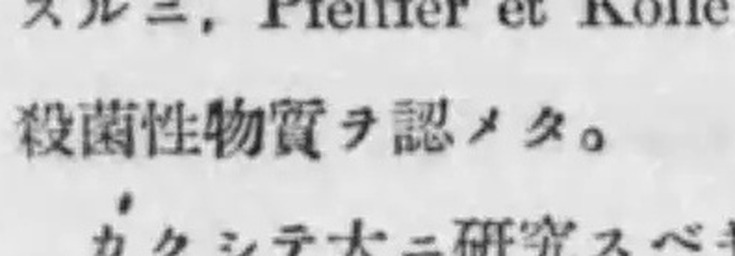殺菌性物質を認めた。
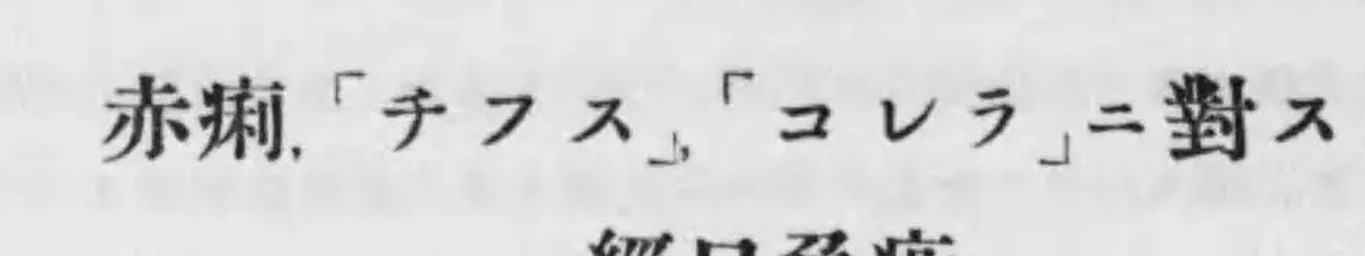赤痢、「チフス」、「コレラ」に対する
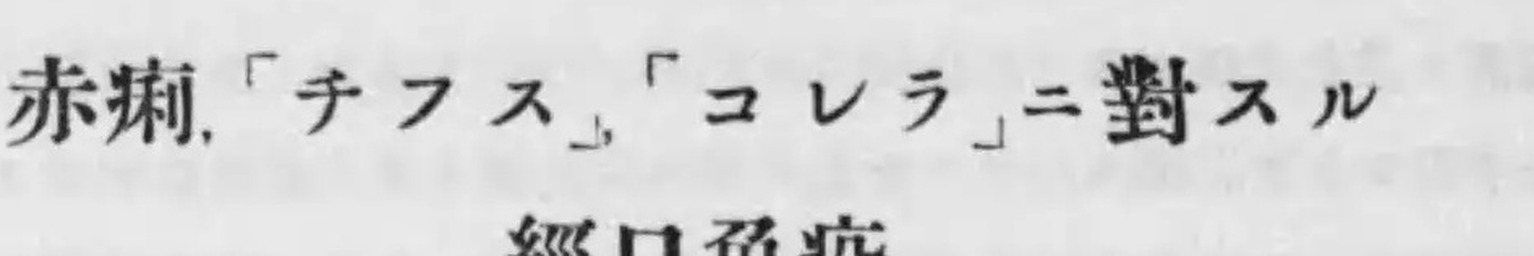赤痢、「チフス」、「コレラ」に対する
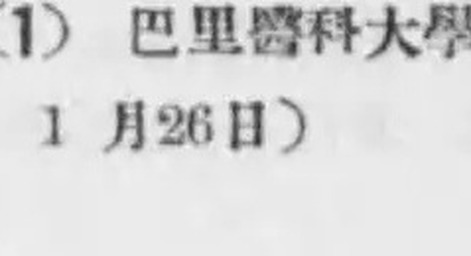月日)

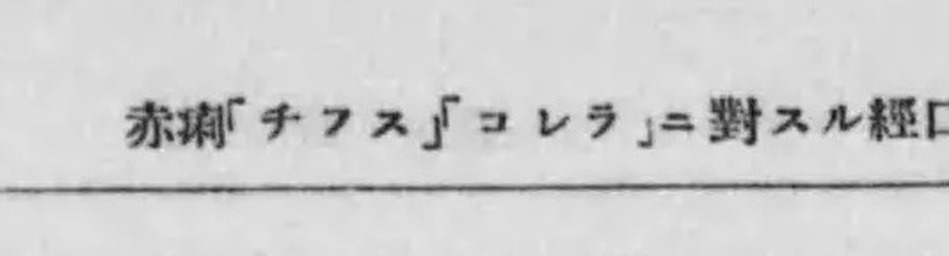赤痢「チフス」「コレラ」に対する経口免疫
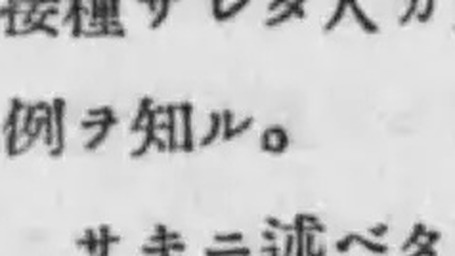例を知る。

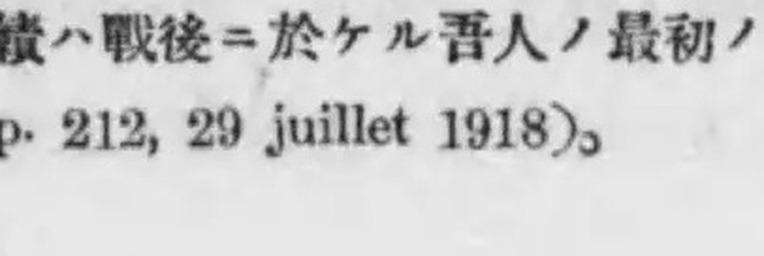,,,,,)。
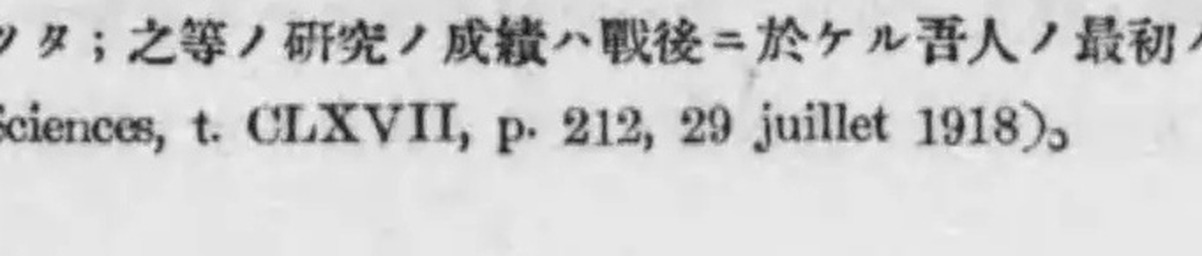,,,,,)。

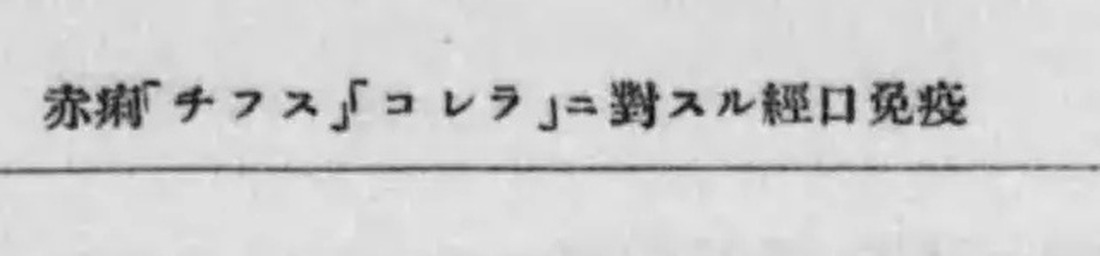赤痢「チフス」「コレラ」に対する経口免疫
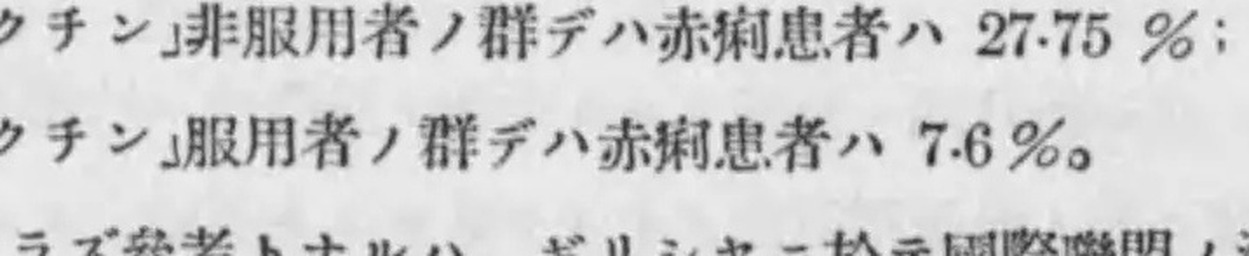「ワクチン」服用者の群では赤痢患者は,%。

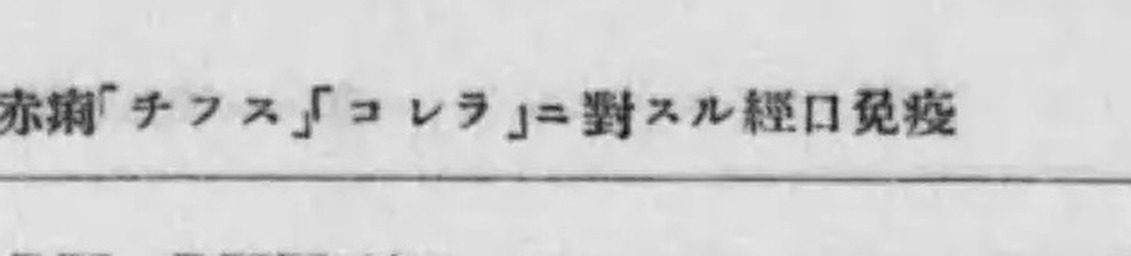赤痢「チフス」「コレラ」に対する経口免疫

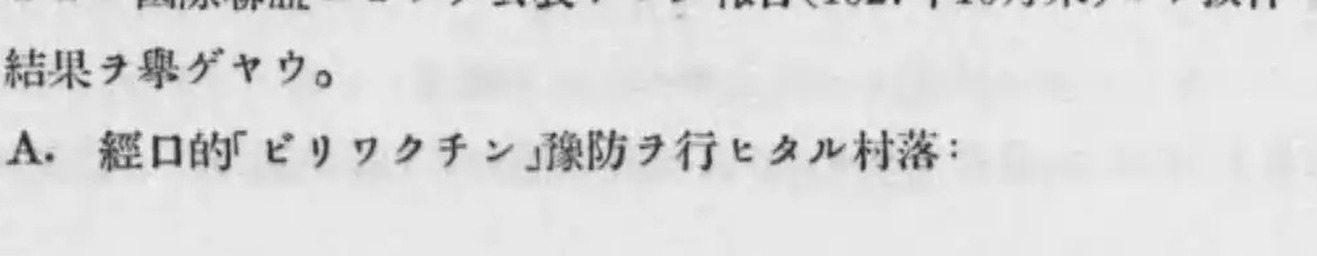,経口的「ビリワクチン」予防を行ひたる村落:
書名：伝染病ニ於ケル免疫ニ関スル研究
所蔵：国立国会図書館 National Diet Library, JAPAN
